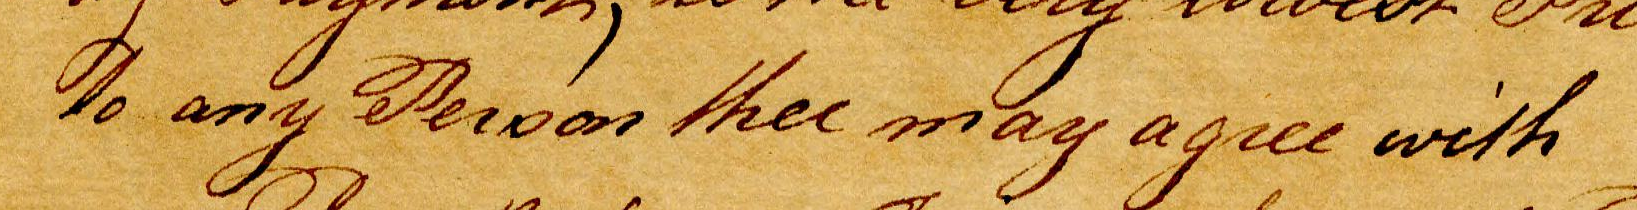To any Person thee may agree with
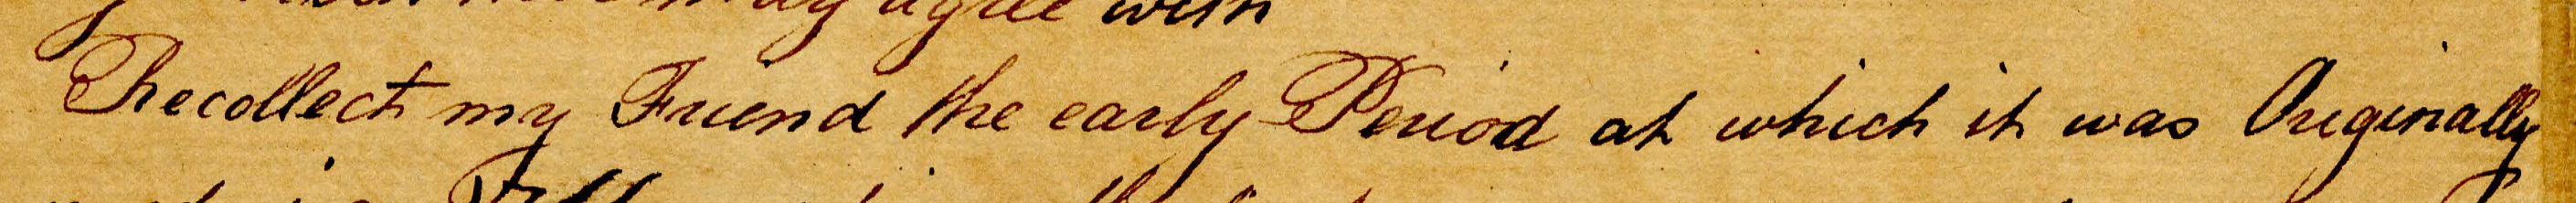Recollect my Friend the early Period at which it was Originally
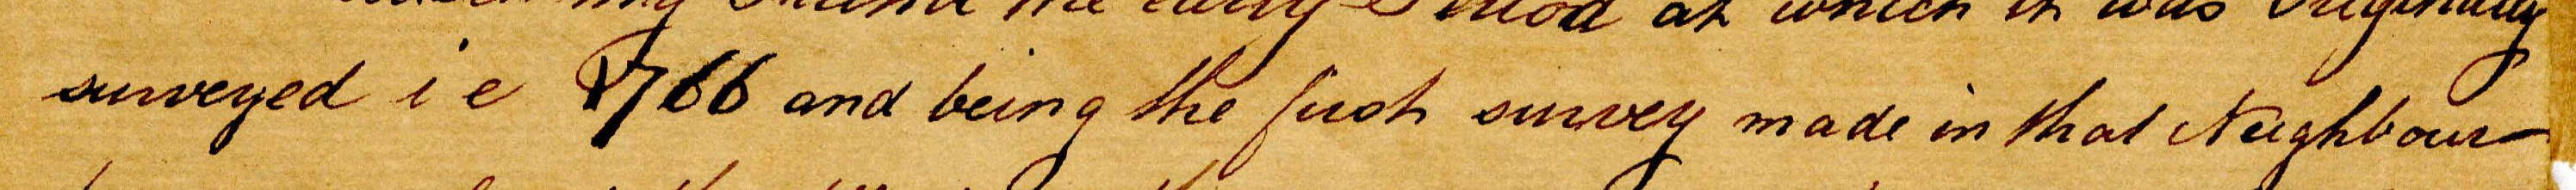surveyed ie 1766 and being the first survey made in that Neighbour-
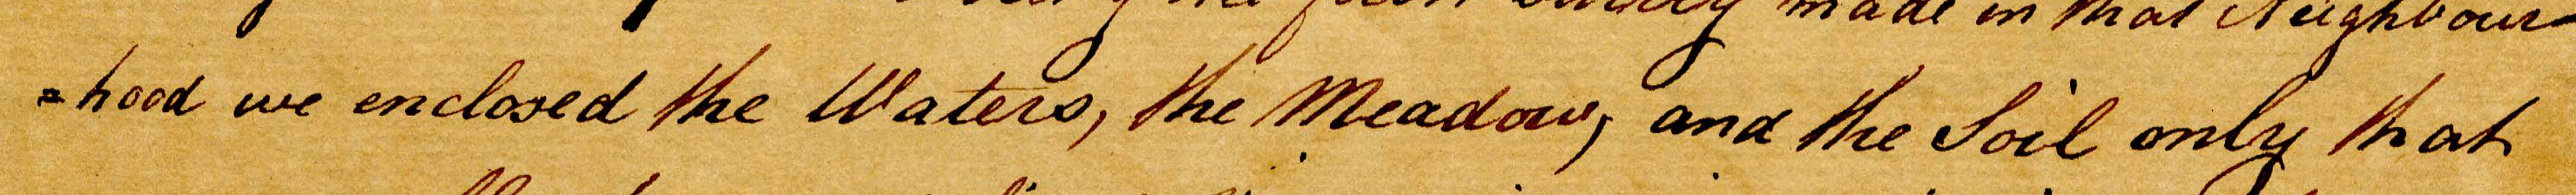-hood we enclosed the Waters, the Meadow, and the soil only that
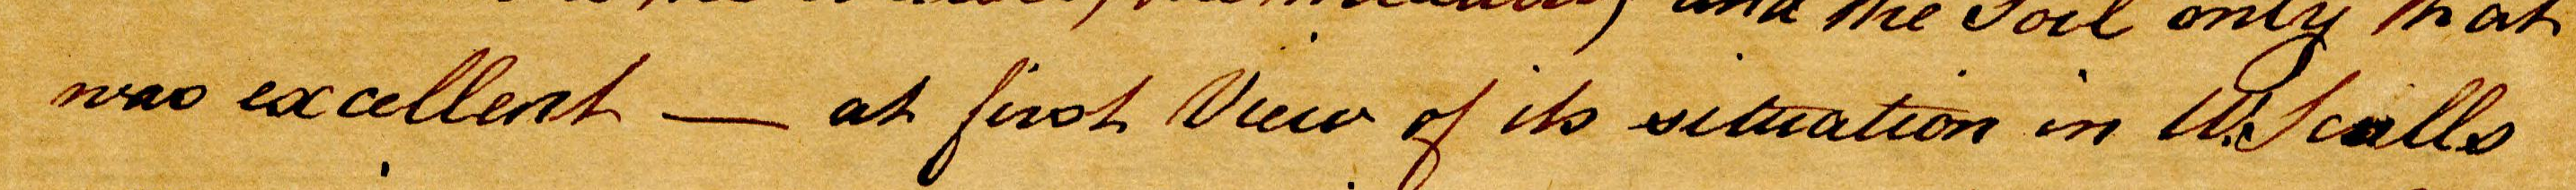was excellent- at first View of its situation in W. Scalls
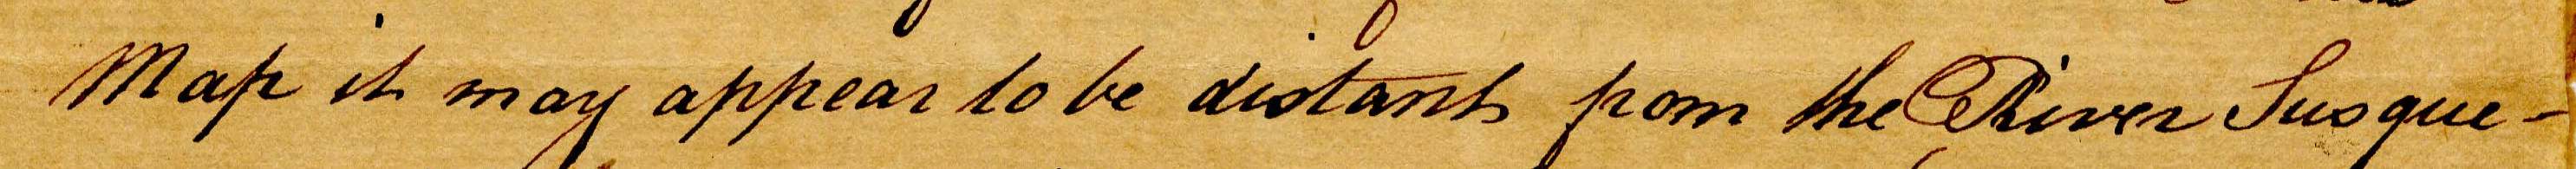Map it may appear to be distant from the River Susque-
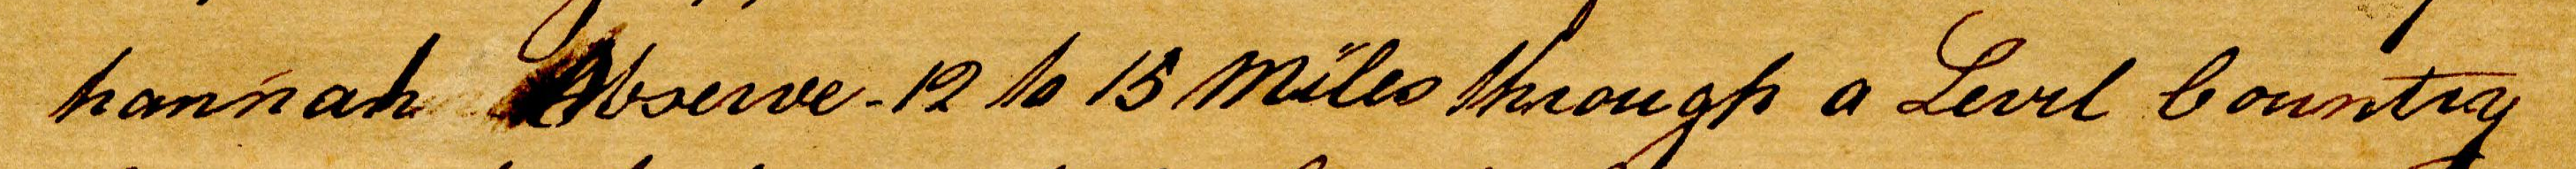hannah Observe. 12 to 15 Miles through a Level Country
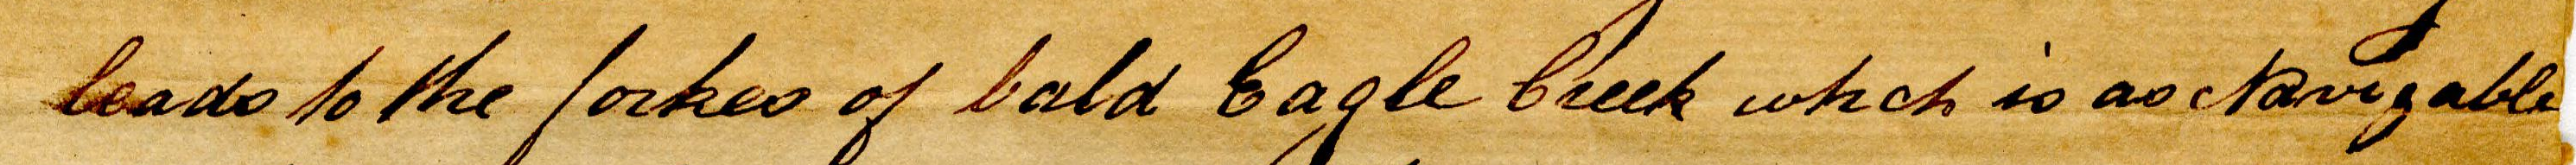leads to hte forkes of bald Eagle Creek which is as Navigable
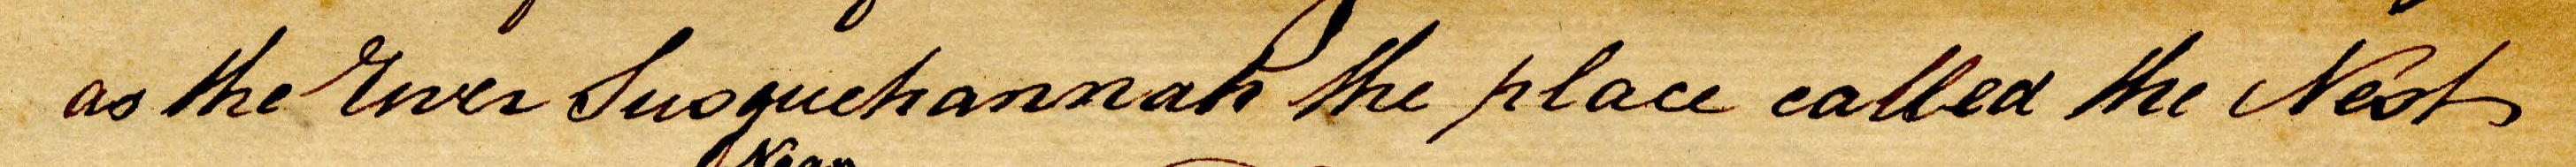as the river Susquehannah the place called the Nest
